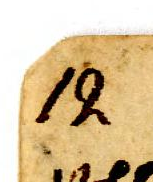12
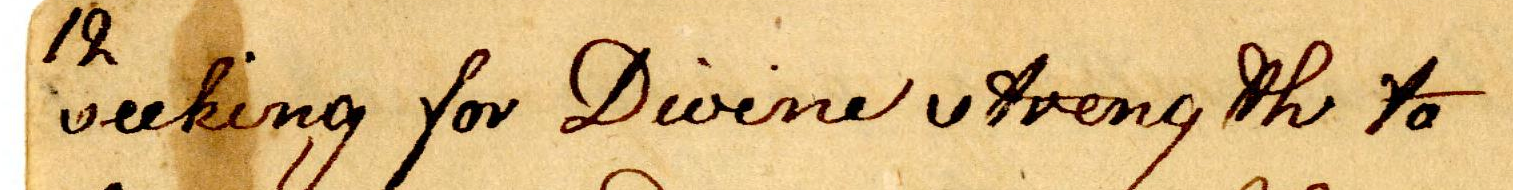seeking for Divine strength to
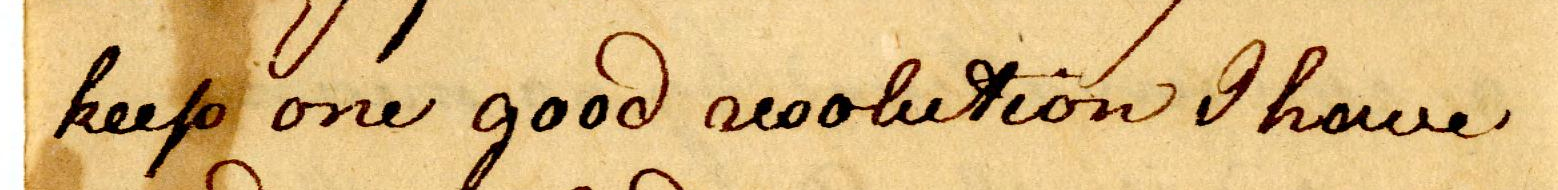keep one good resolution I have
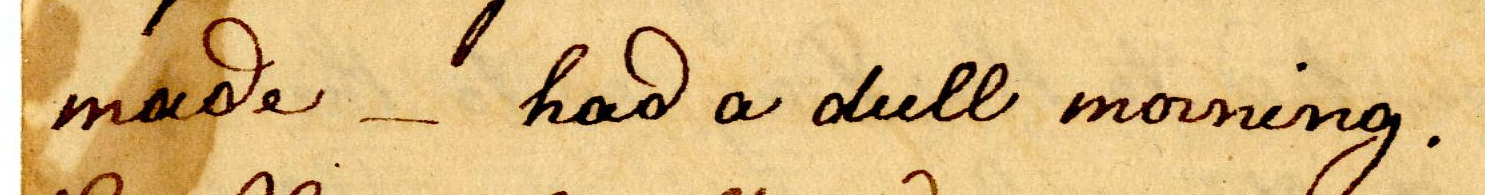made- had a dull morning.
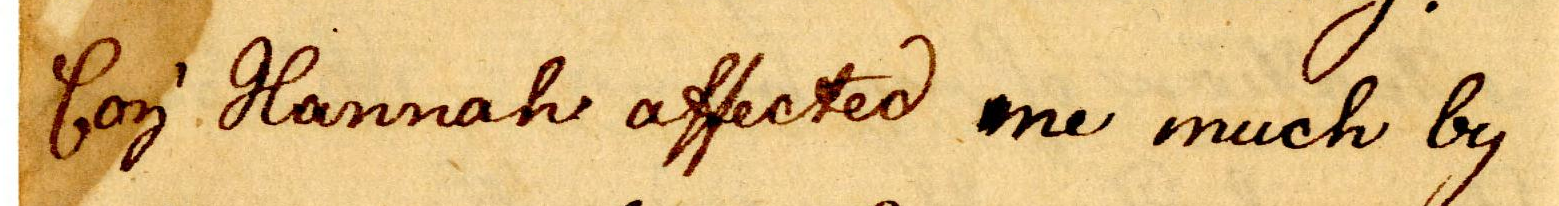Coz' Hannah affected me much by
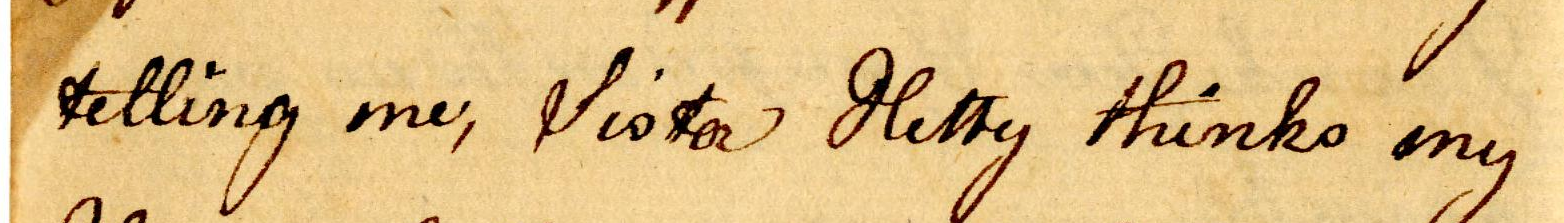telling me, Sister Hetty thinks my
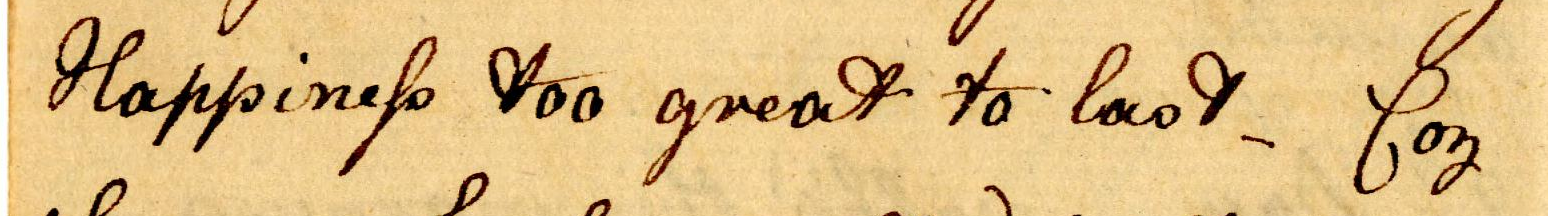Happiness too great to last- Coz
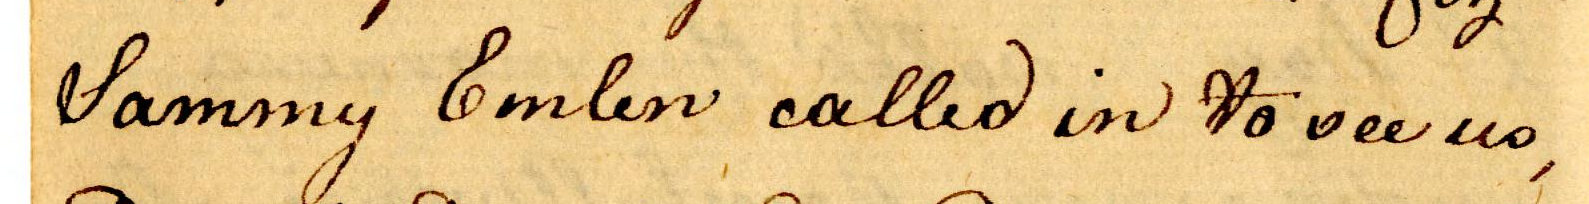Sammy Emlen called in to see us,
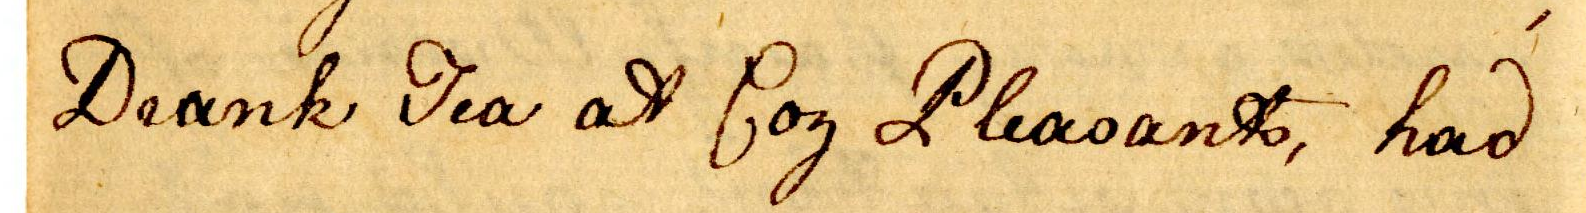Drank Tea at Coz Pleasants, had
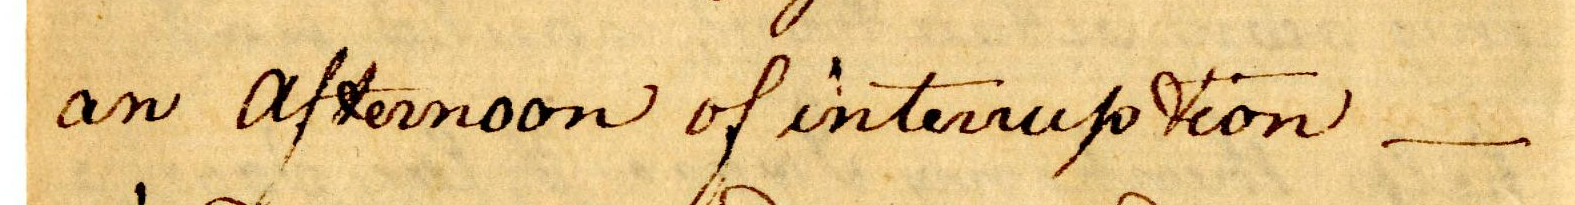an Afternoon of interruption-
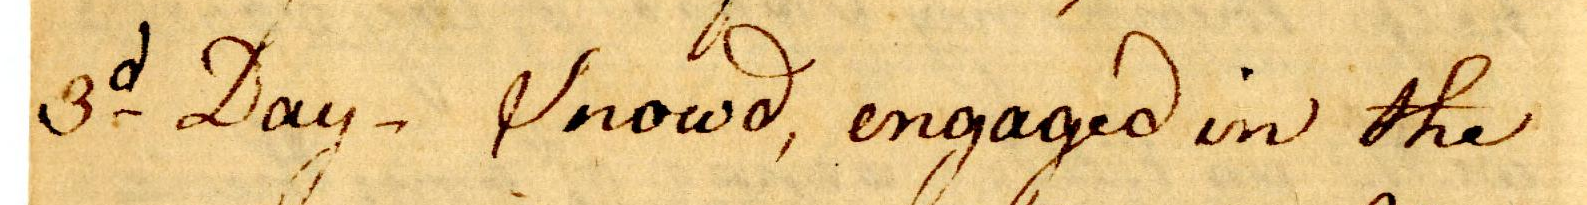3^d Day- Snowd, engaged in the
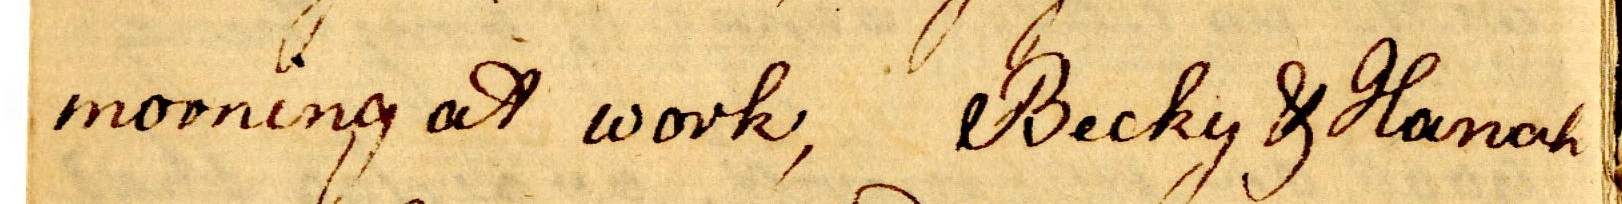morning at work, Becky & Hannah
